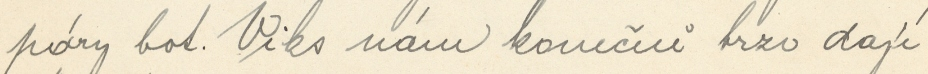páry bot. Viks nám konečně brzo dají
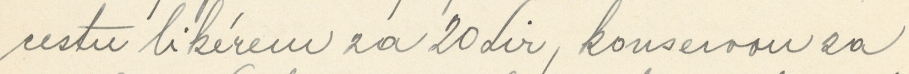cestu likérem za 20 dir, konservou za
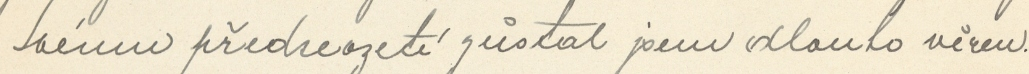Svému předsevzetí zůstal jsem dlouho věren.
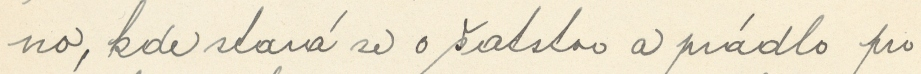no, kde stará se o šatstvo a prádlo pro
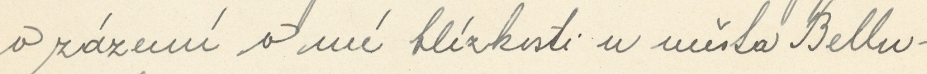v zázemí v mé blízkosti u města Bellu-
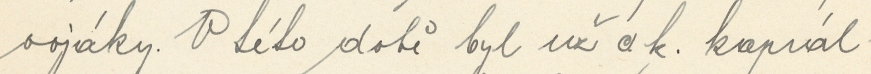vojáky. V této době byl už c. k. kaprál -
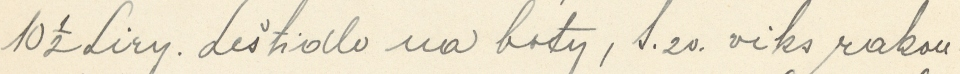10 1/2 Liry. Leštidlo na boty, t. zv. viks rakou-
